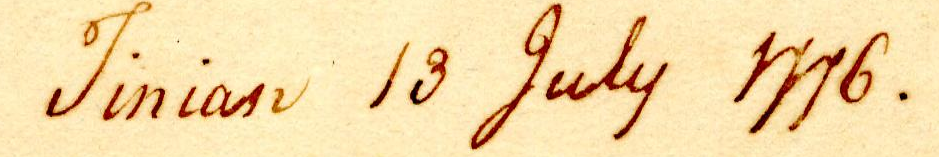Tinian 13 July 1776.
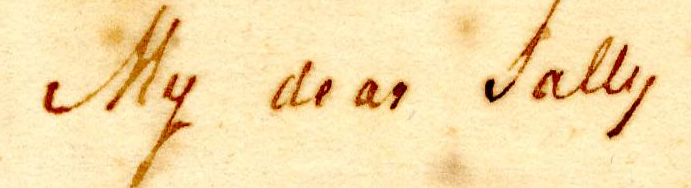My dear Sally
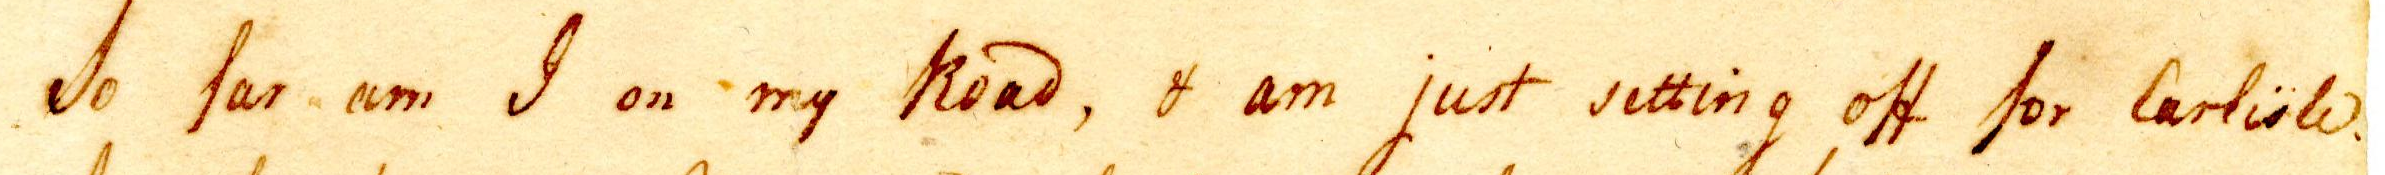So far am I on my Road, & am just setting off for Carlisle.
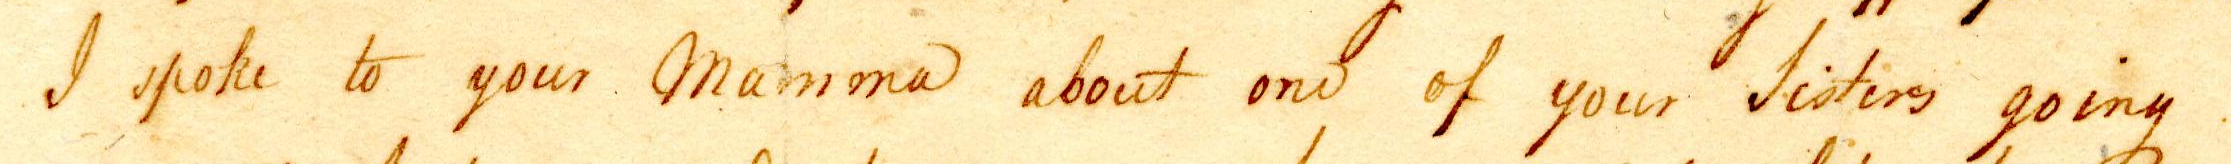I spoke to your Mamma about one of your Sisters going
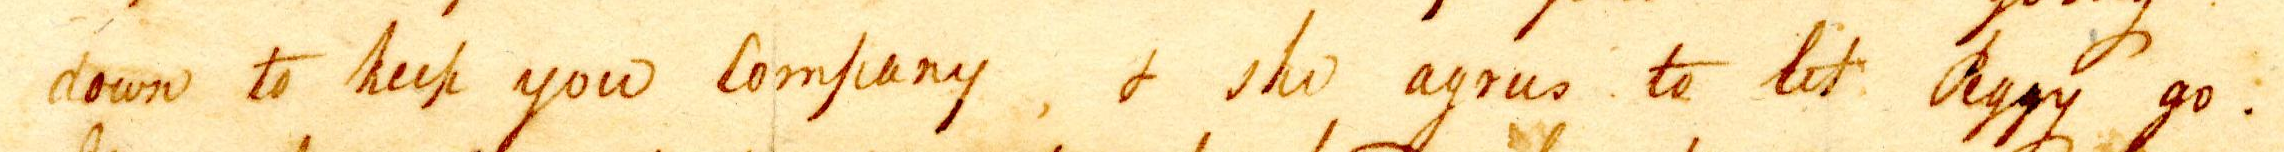down to keep you company, & she agrees to let Peggy go.
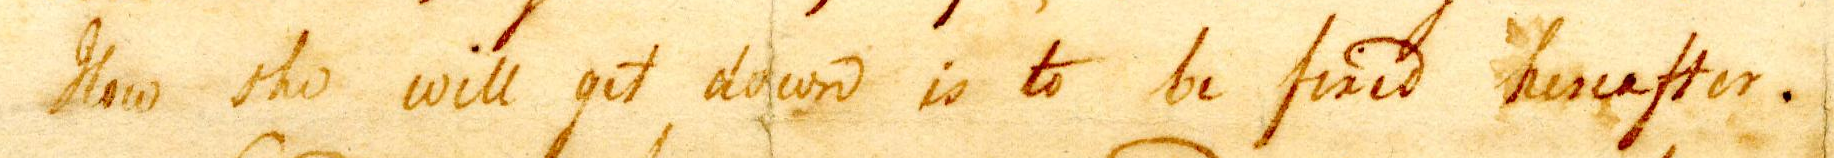How she will get down is to be fixed hereafter.
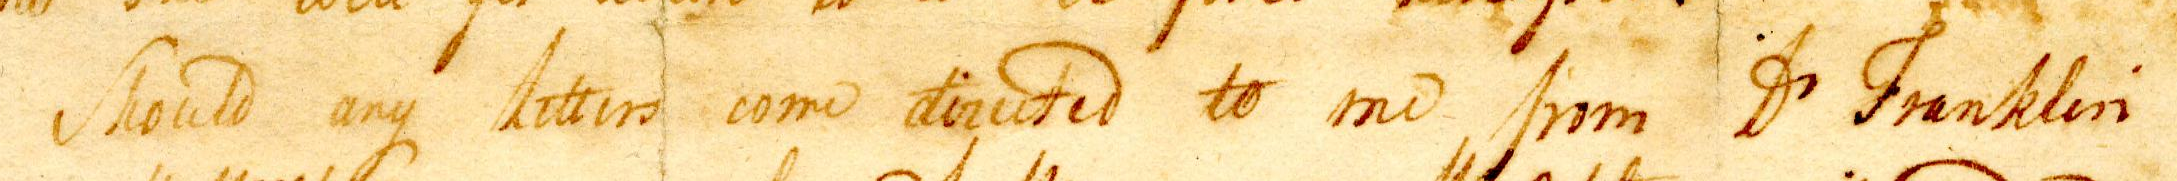Should any Letters come directed to me from D^r Franklin
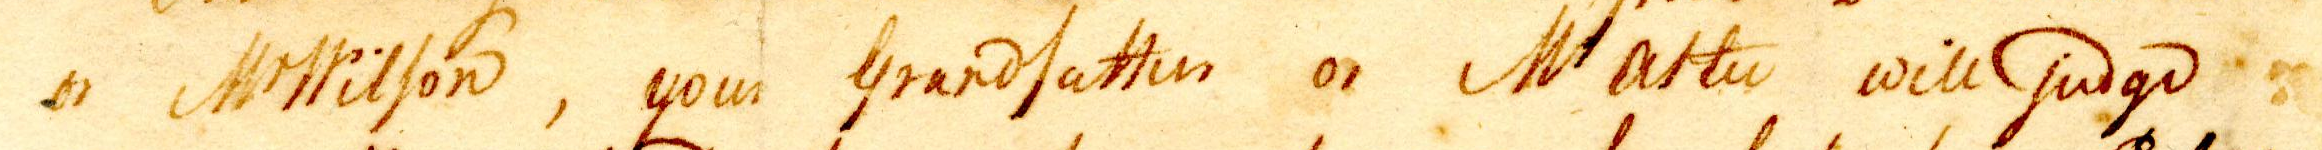or M^r Wilson, your Grandfather or M^r Aster will judge
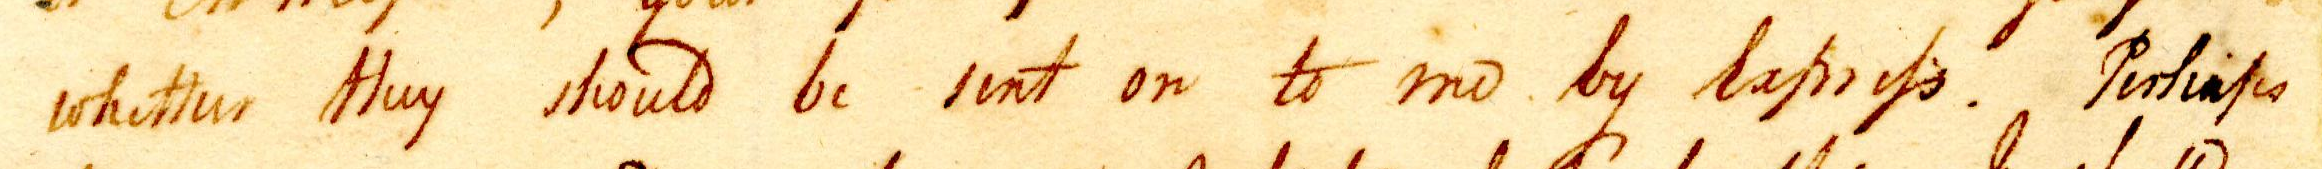whether they should be sent on to me by Express. Perhaps
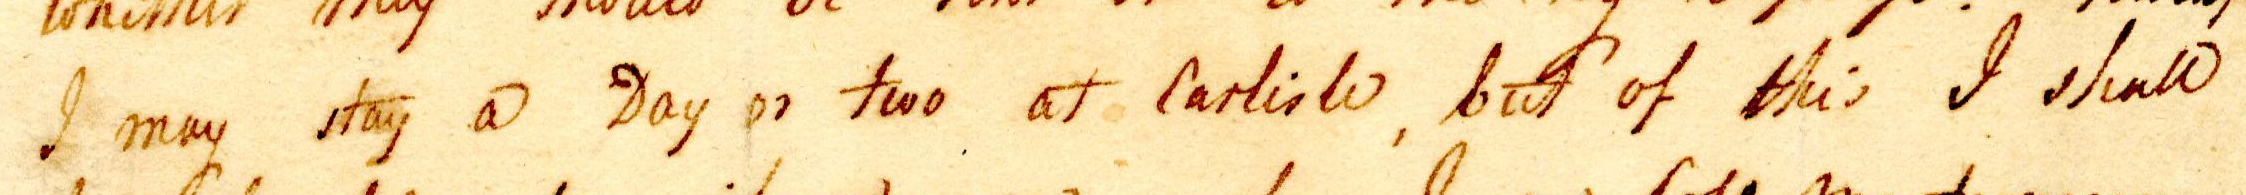I may stay a Day or two at Carlisle but of this I shall
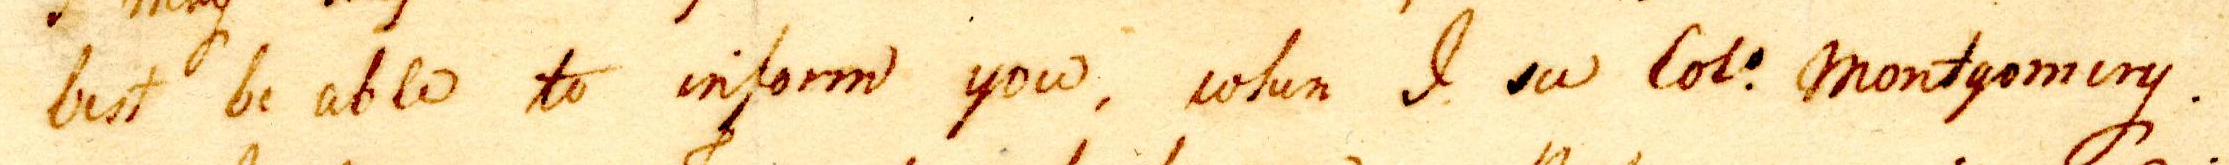best be able to inform you, when I see Col^o. Montgomery.
